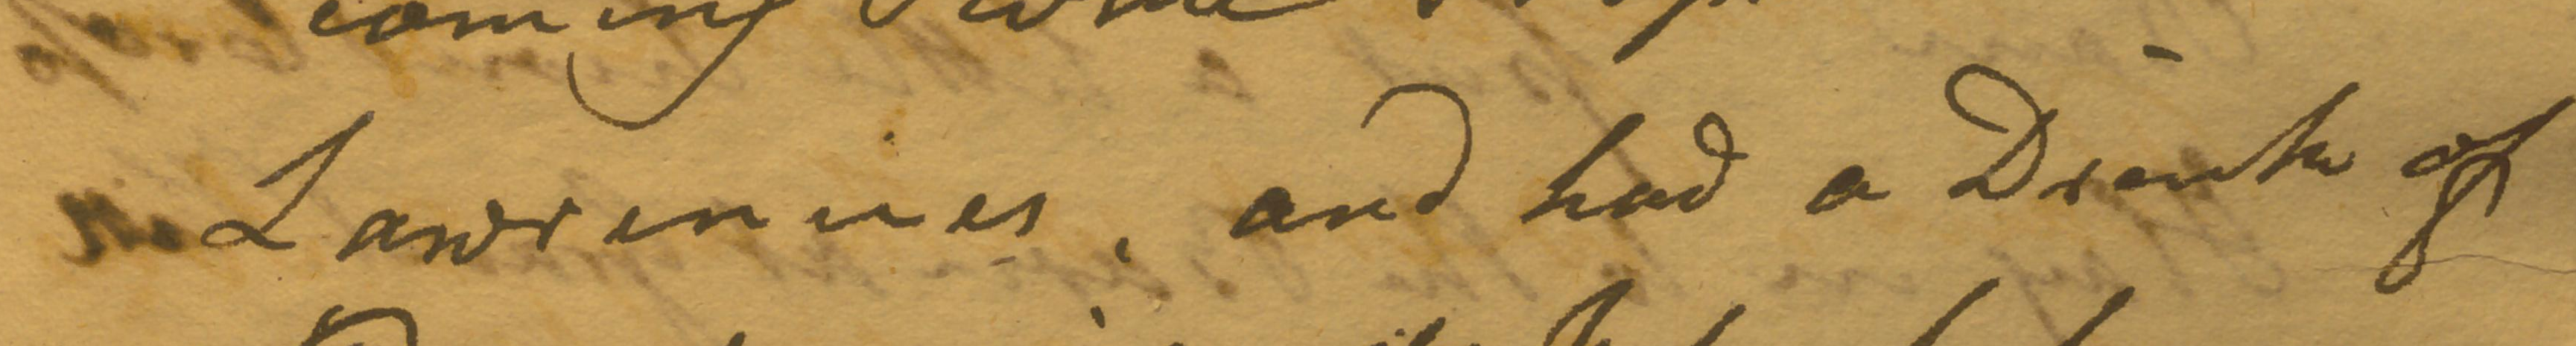Lawrences, and had a Drink off
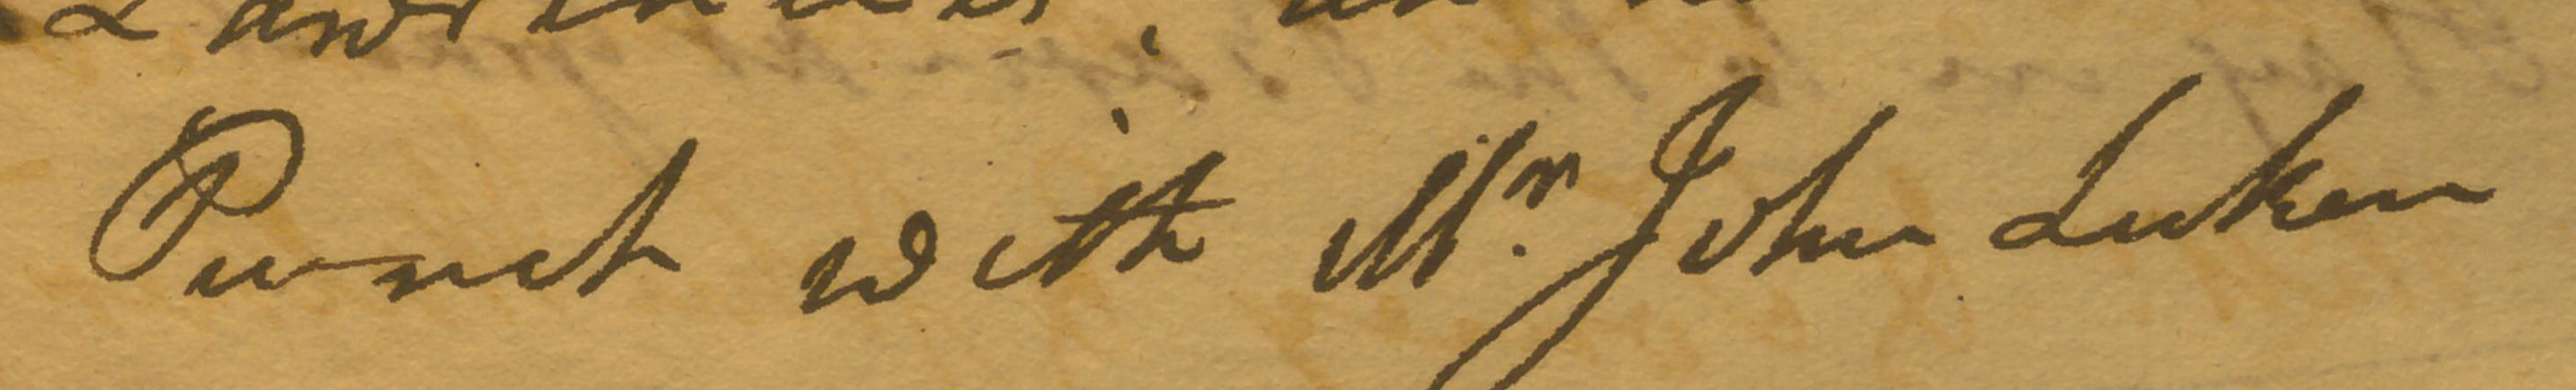Punch with M^r. John Luken
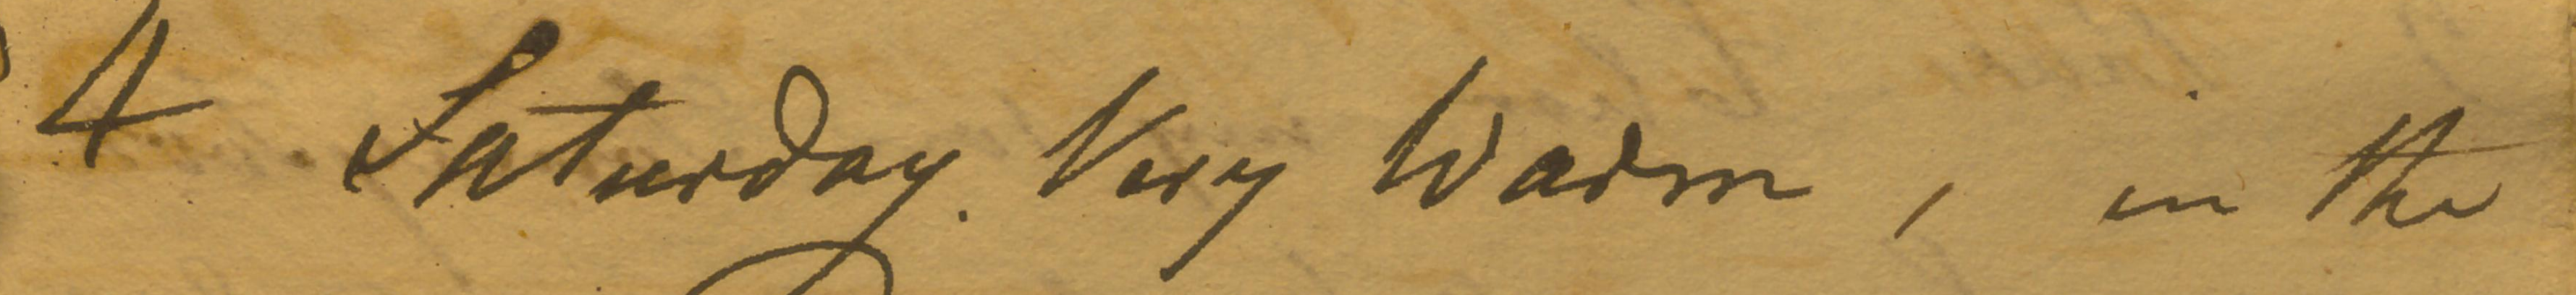4 Saturday Very Warm, in the
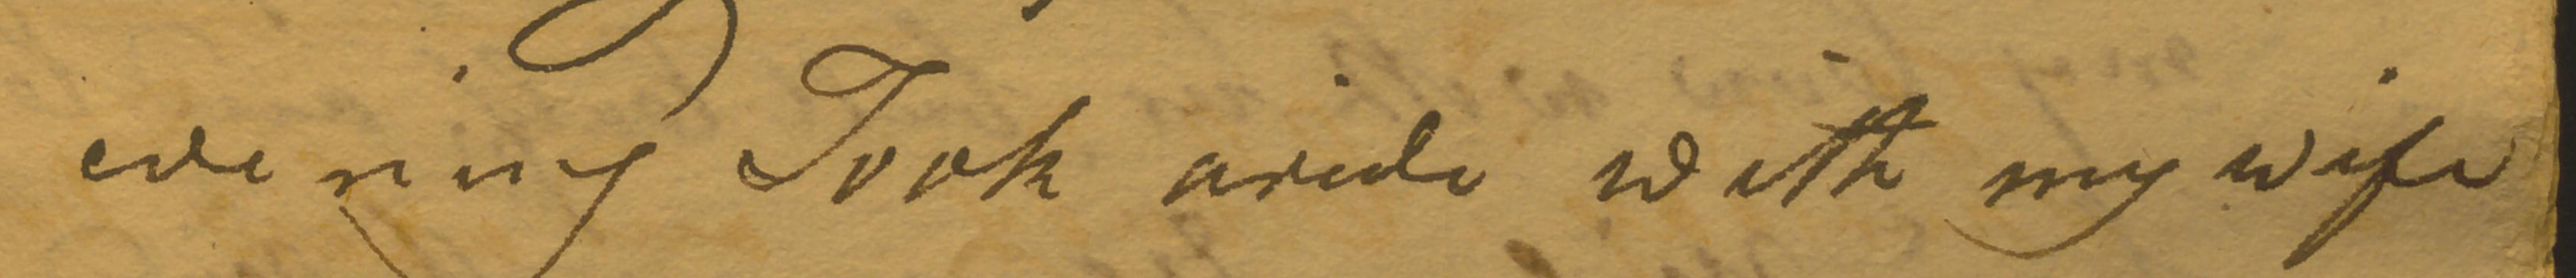evening Took a ride with my wife
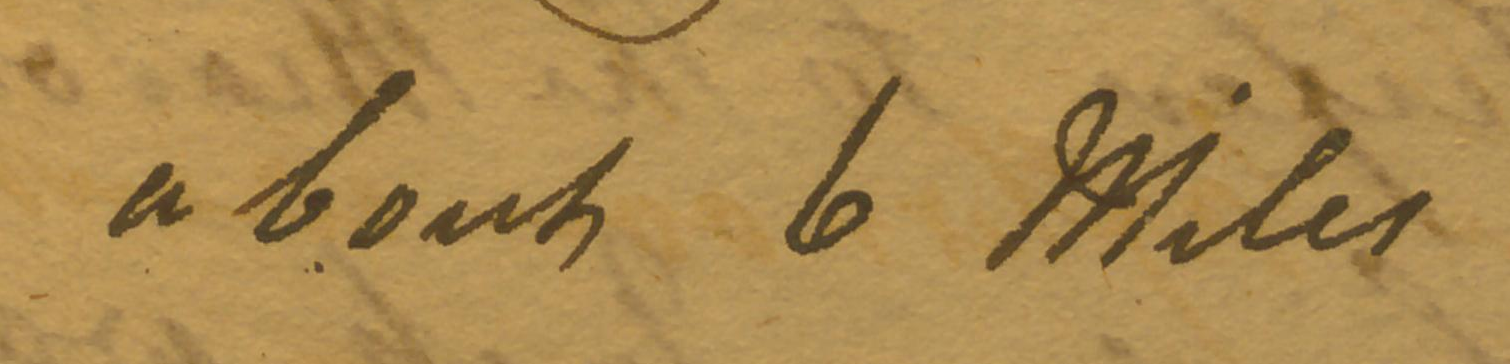about 6 Miles
